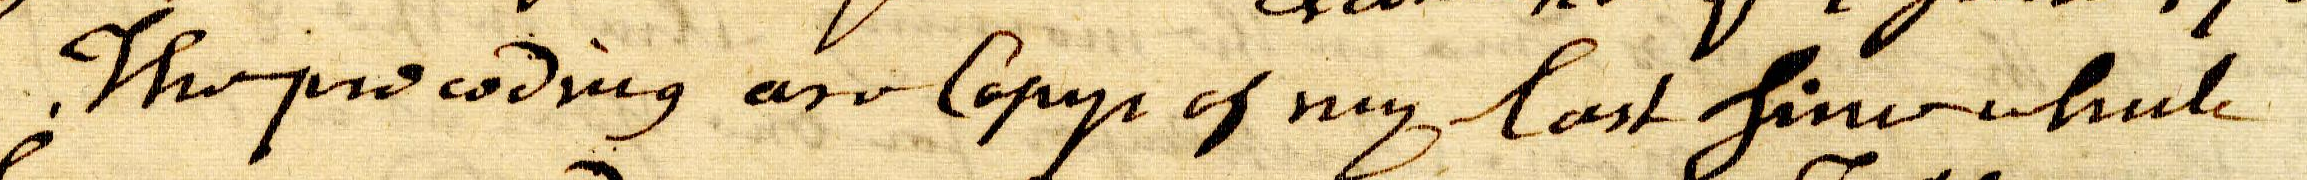The preceding are Copys of my last since which
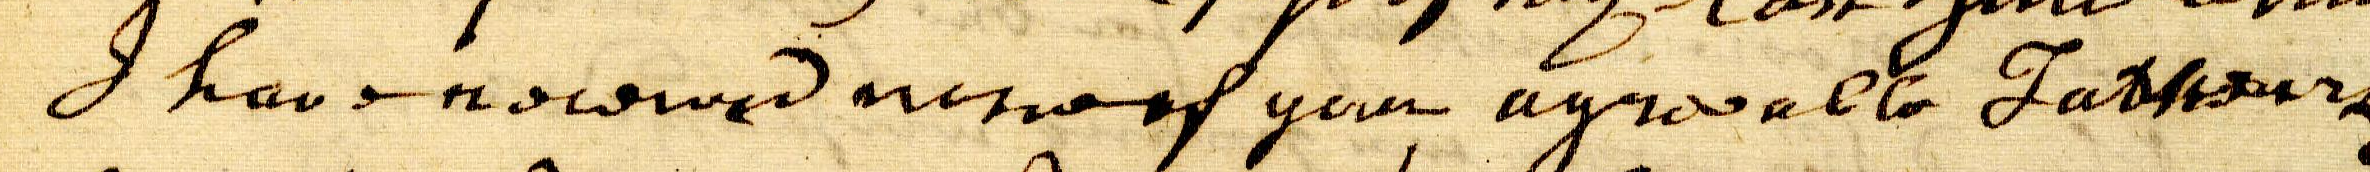I have received none of your agreeable Favours
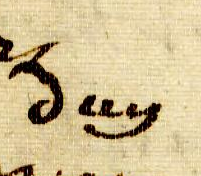day
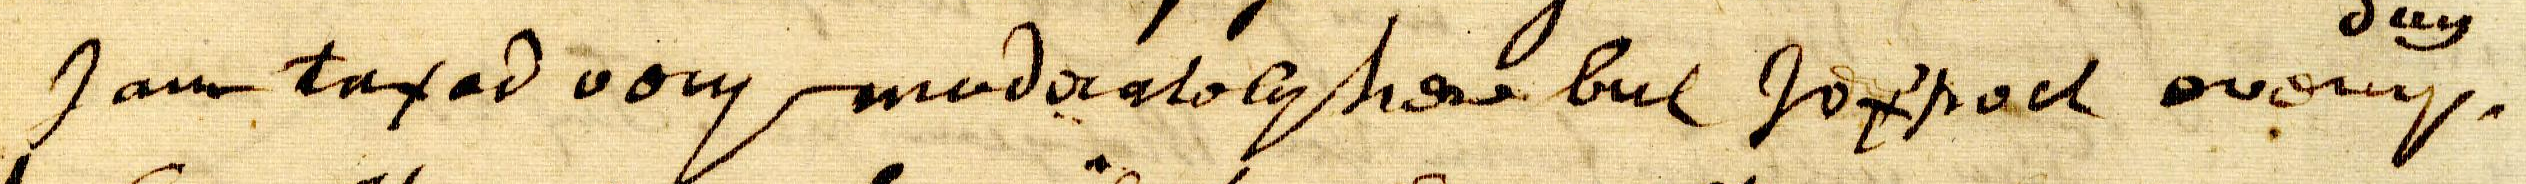I am taxed very moderately here but I expect every-
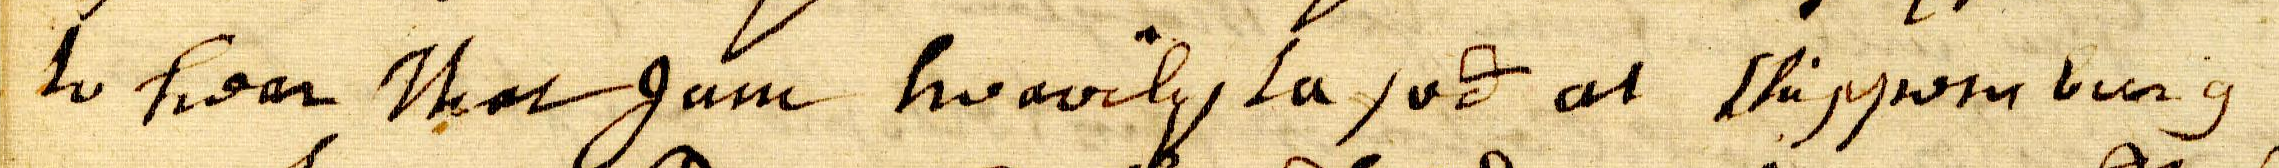to hear that I am heavily taxed at Shippensburg
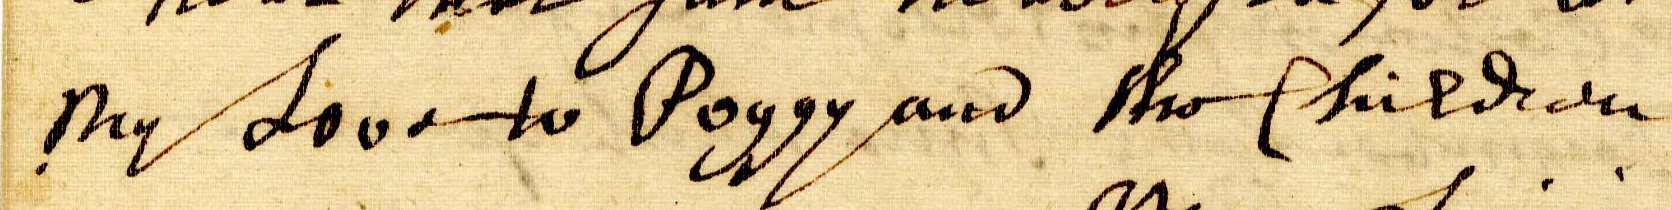My Love to Peggy and the Children
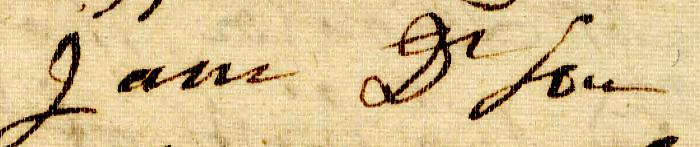I am D^r Son
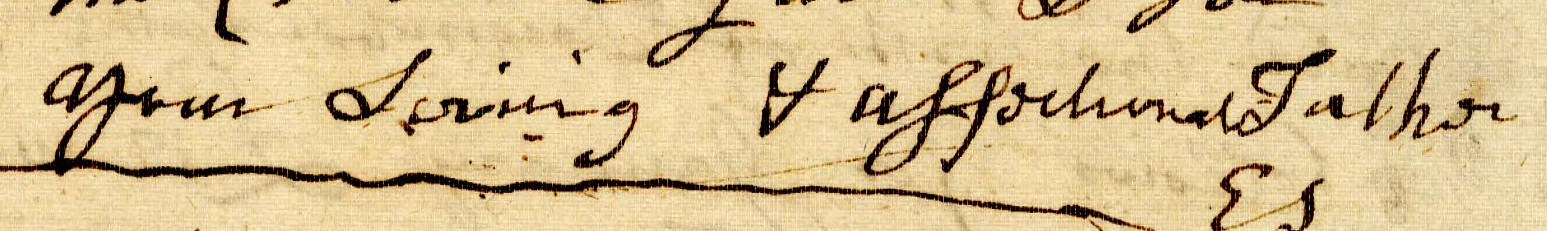Your Loving & affectionate Father
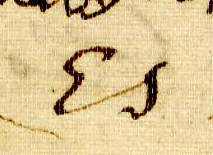ES
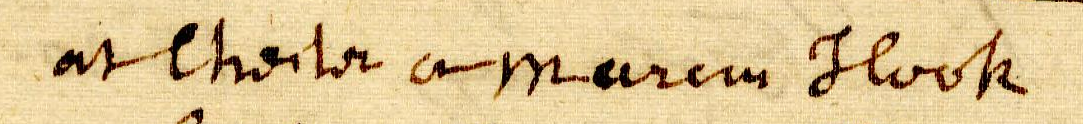at Chester a Marcus Hook
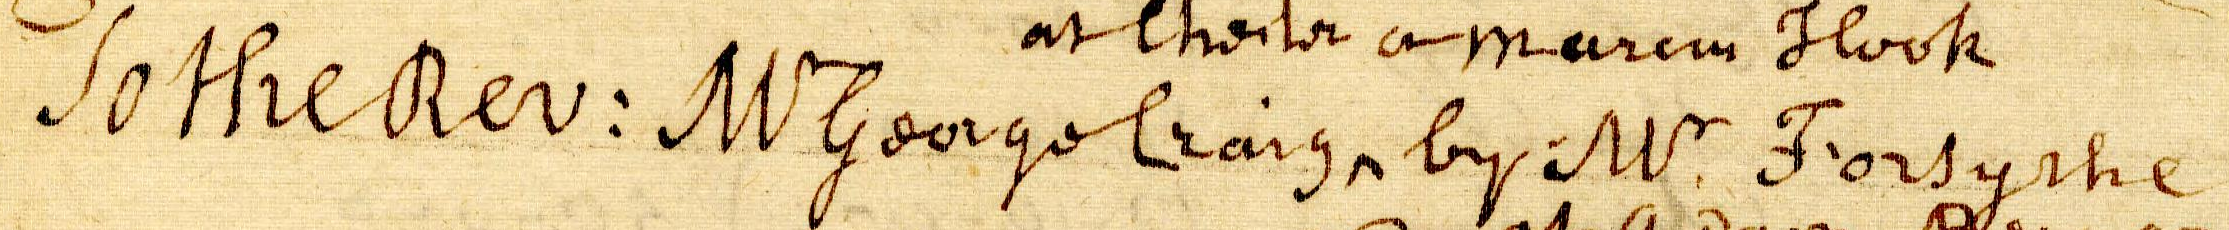To the Rev: M^r George Craig^ by M^r. Forsythe
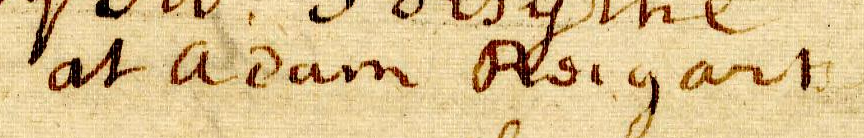at Adam Reigarts
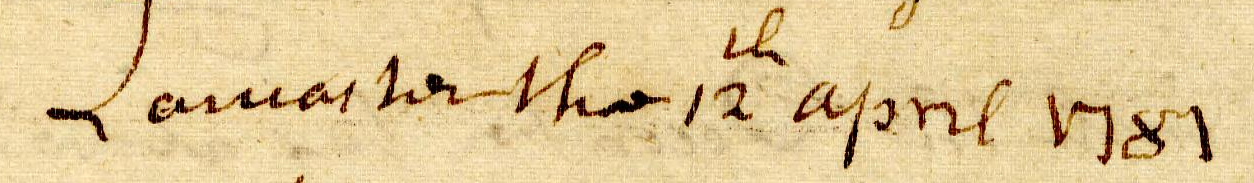Lancaster the 12^th April 1781
